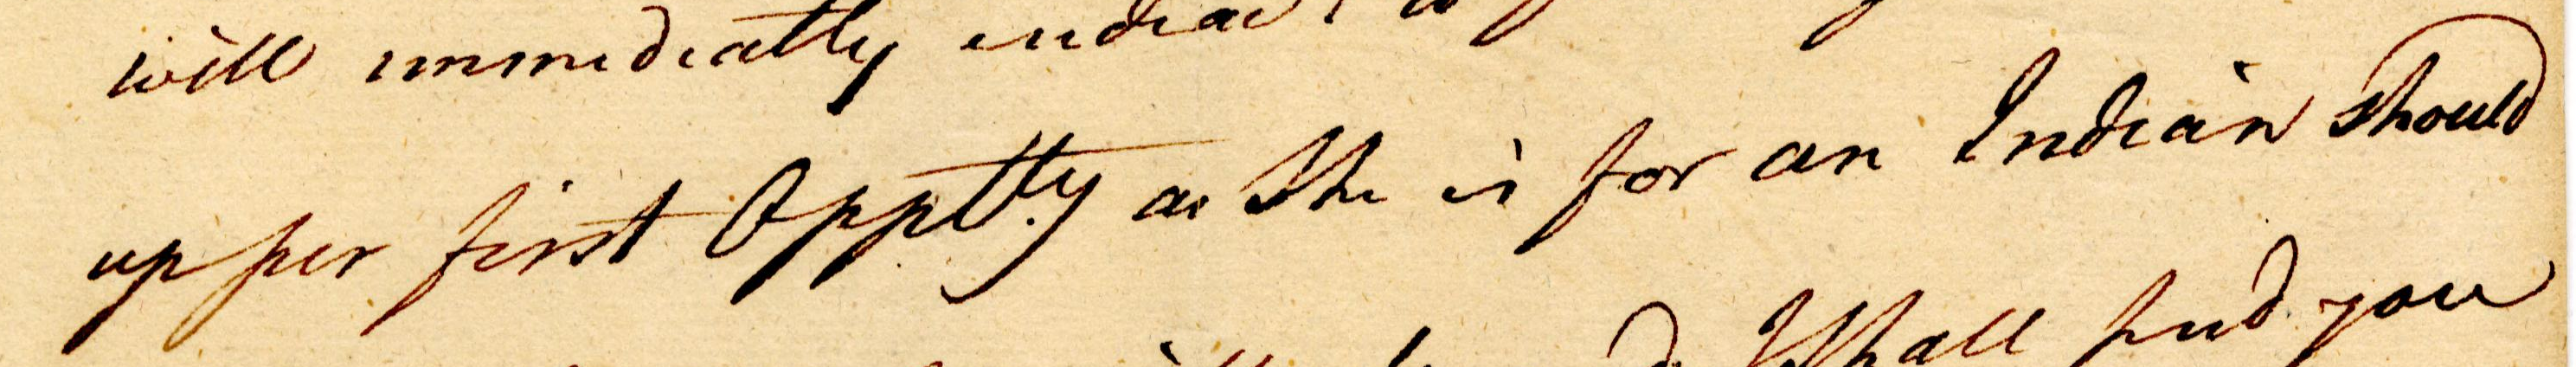up per first Opp^ty as she is for an Indian should
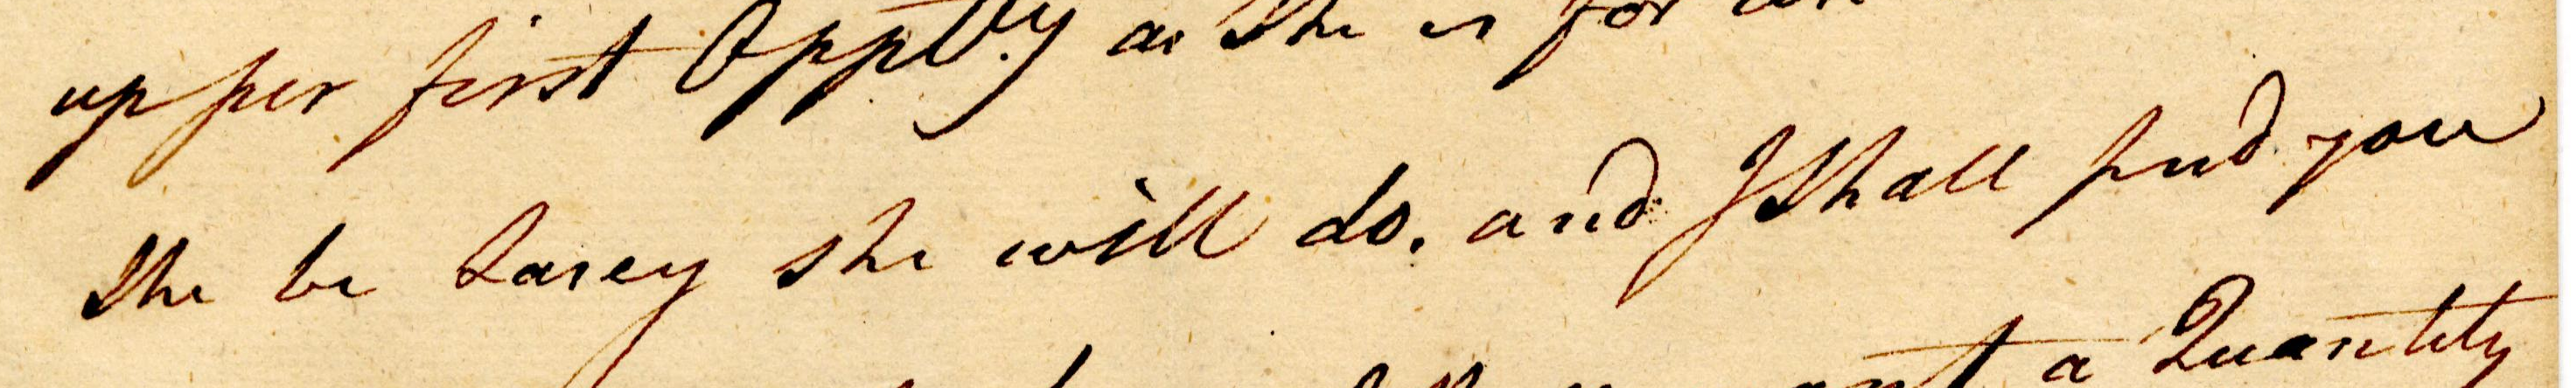she be Laney she will do, and I shall send you
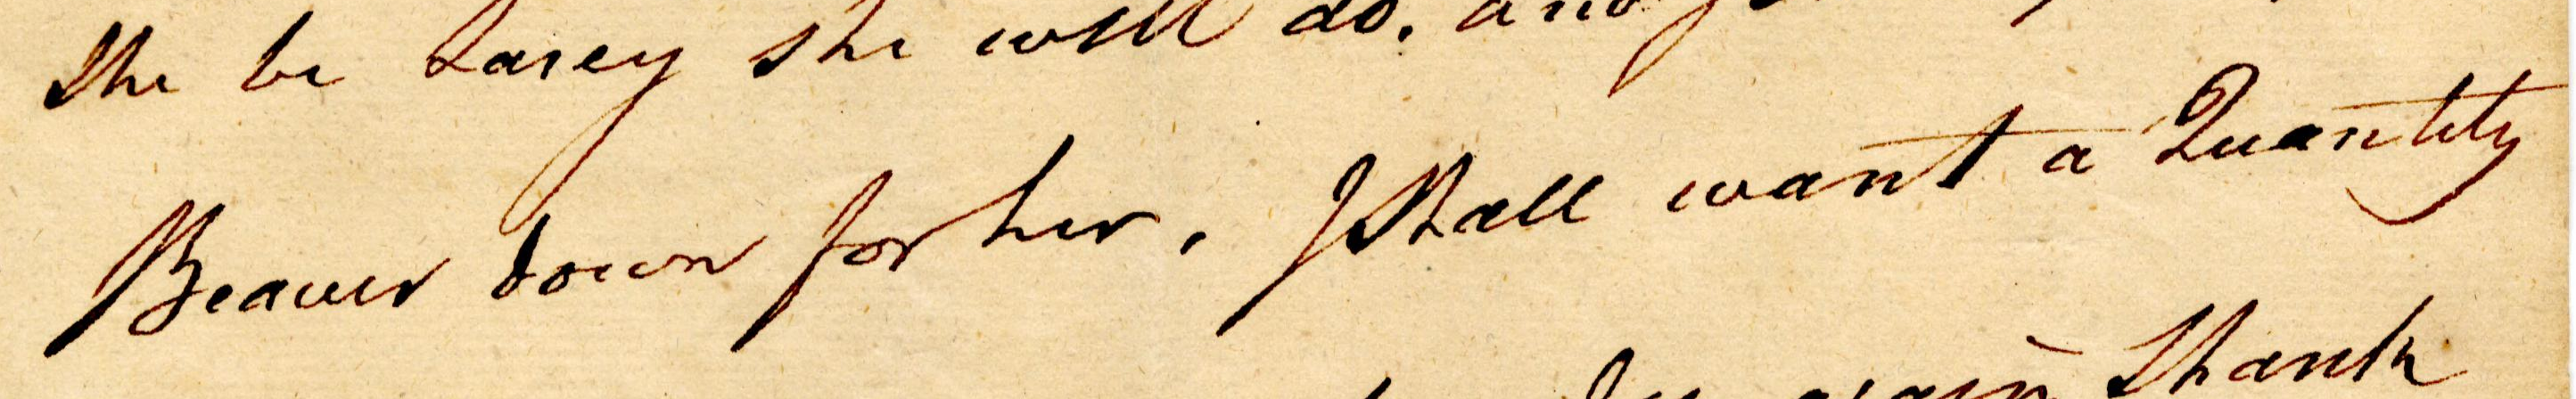Beaver down for her, I Shall want a Quantity
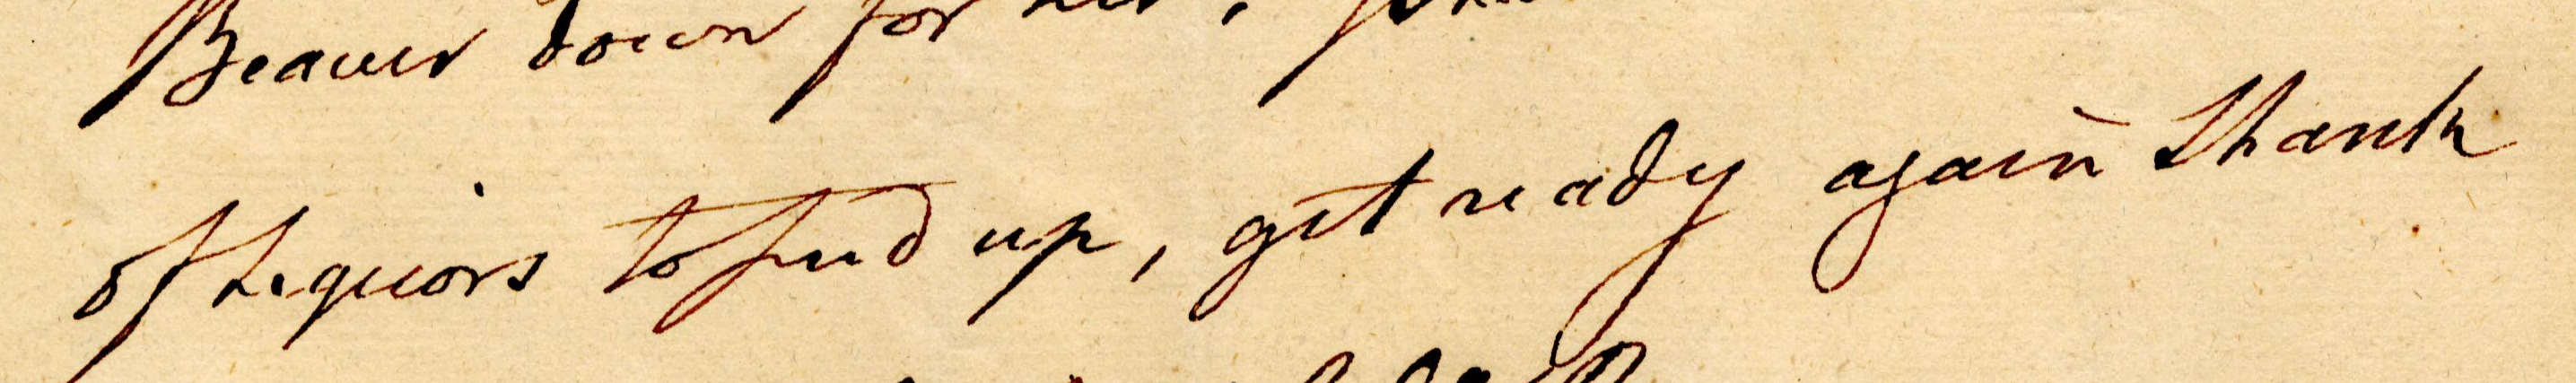of Liquors to send up, get ready again Shank
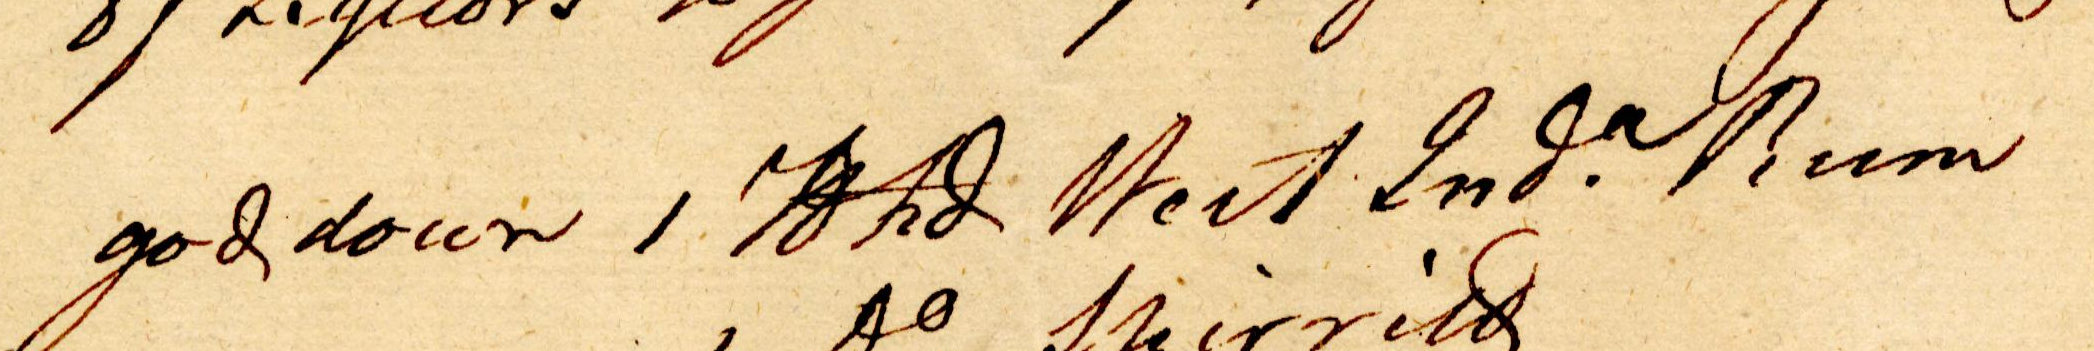goes down 1 Hhd West Ind^a. Rum
